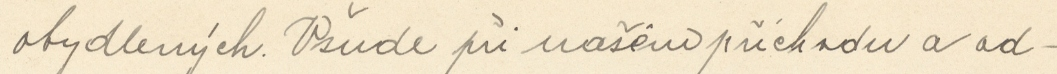obydlených. Všude při našem příchodu a od-
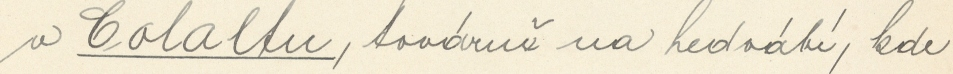v Colaltu, továrně na hedvábí, kde
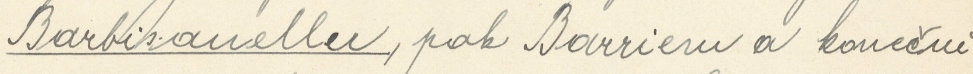Barbisanellu, pak Barrier a konečně
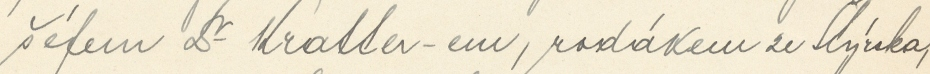šéfem Dr Kratter-em, rodákem ze Štýrska,
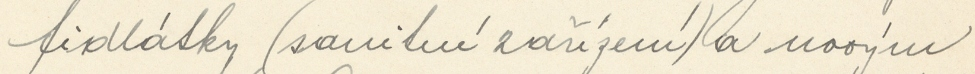fidlátky (sanitní zařízení) a novým
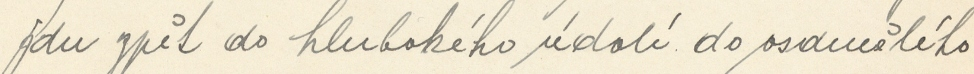jdu zpět do hlubokého údolí do osamělého
